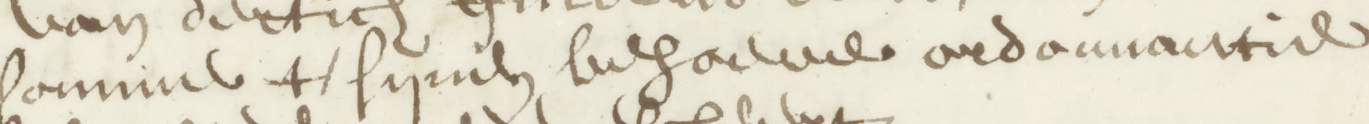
somme t' sijnen behoeve ordonnantie
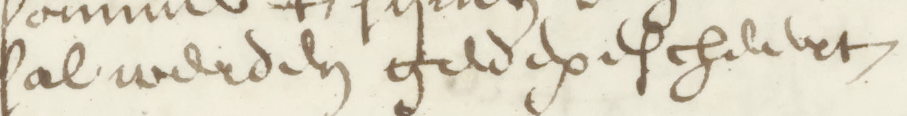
sal werden gedepescheert.
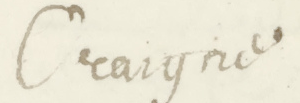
Craigne
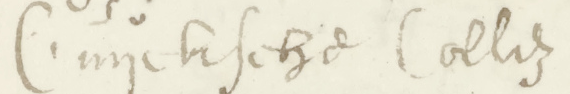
Cuijcksche Tollen
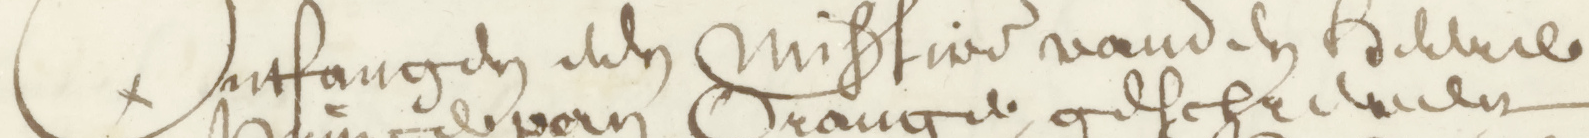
Ontfangen een Missive vanden Heere
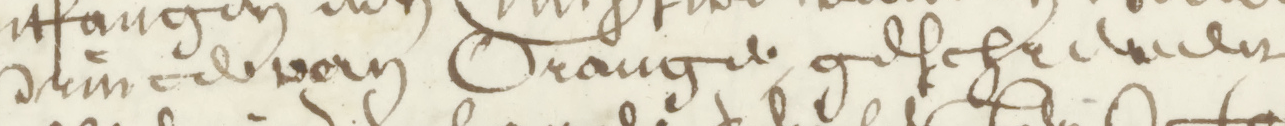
Prince van Orange geschreven
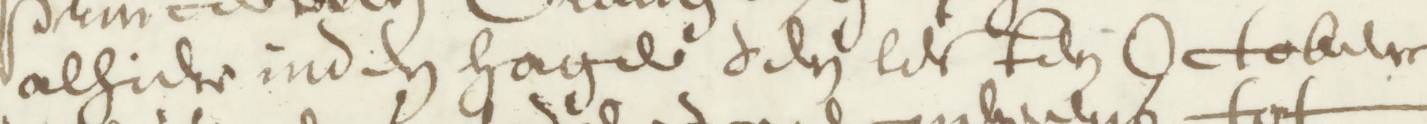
alhier inden hage den lesten October
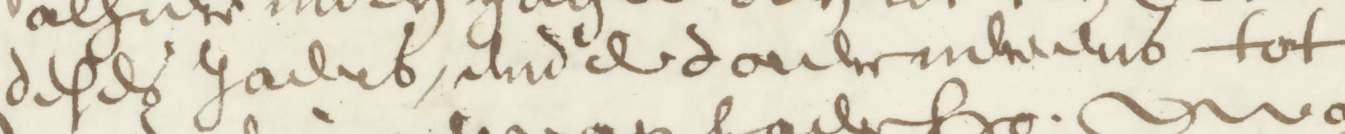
deses Jaers, ende daernevens tot
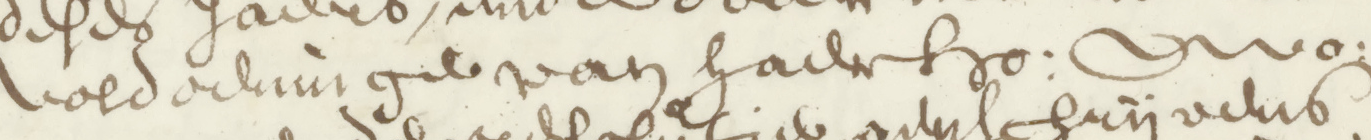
voldoeninge van haer Ho:Mo:
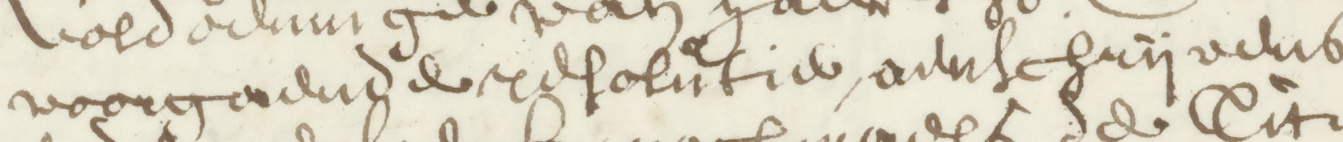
voorgaende resolutie, aenschrijvens
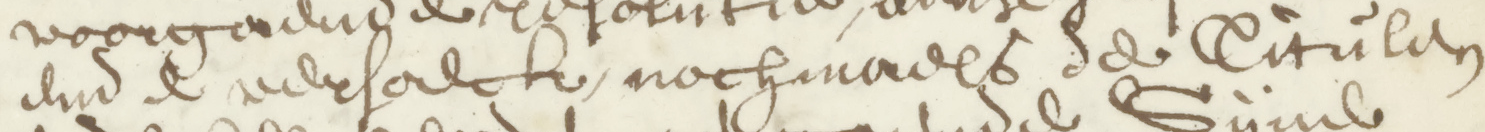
ende versoeck, nochmaels de Titulen
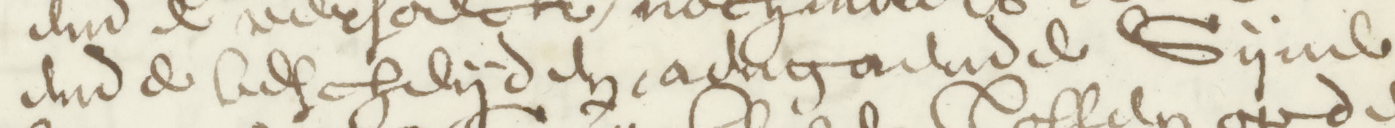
ende bescheijden, aengaende Sijne
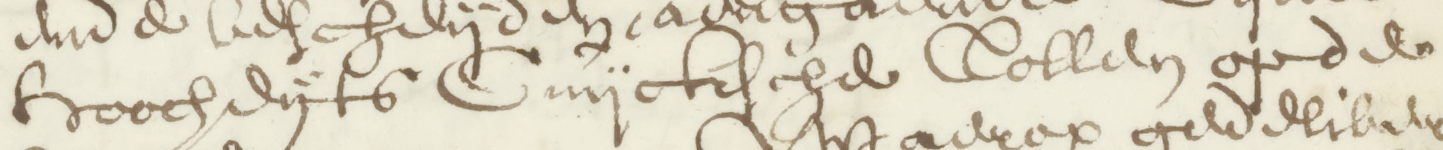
Hoocheijts Cuijcksche Tollen opde
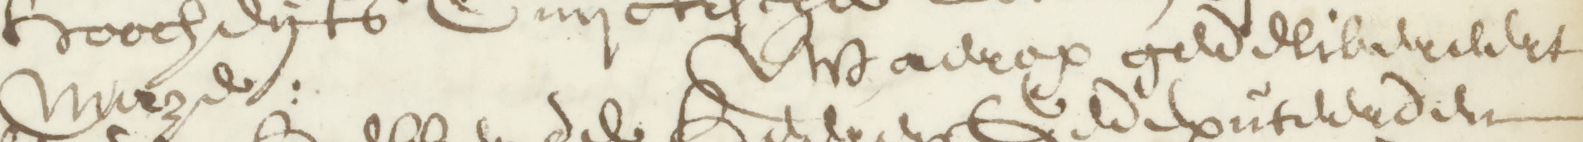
Maze: Waerop gedelibereert
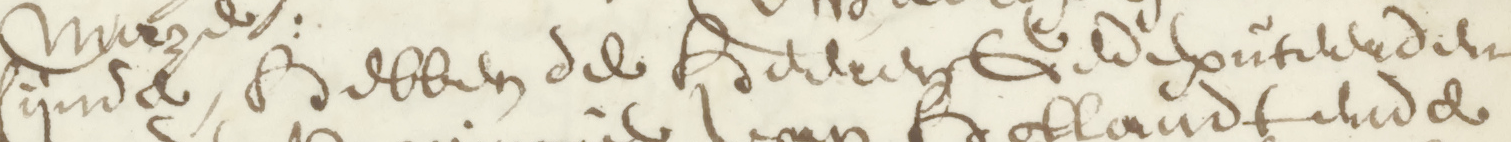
sijnde, Hebben de Heeren Gedeputeerden
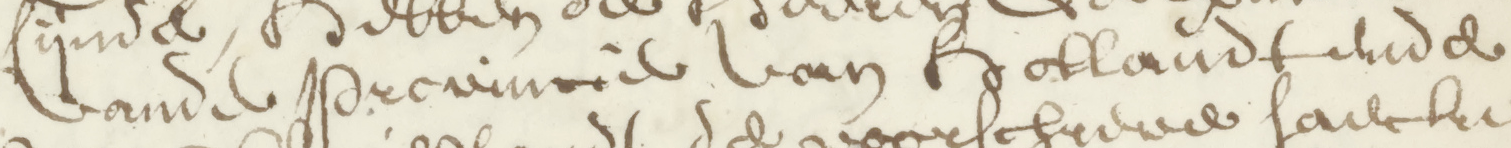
vande Provincie van Hollandt ende
